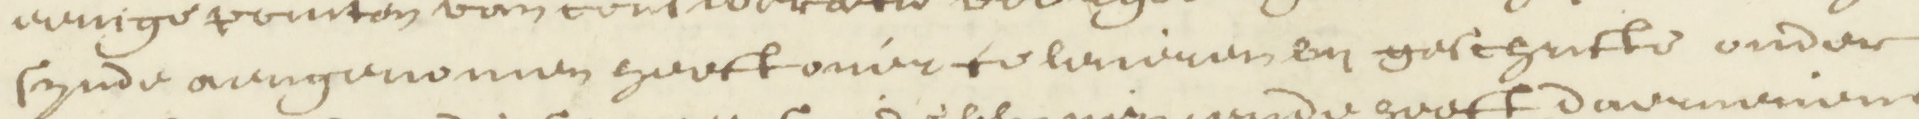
synde aengenomen heeft ouer te leueren by geschrifte onder
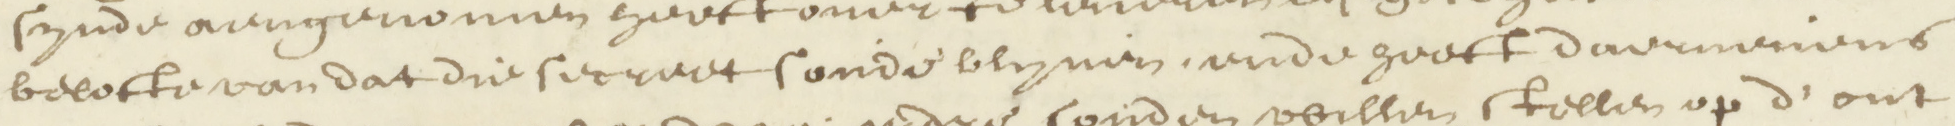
belofte van dat die secreet soude blyuen, ende heeft daerneuens
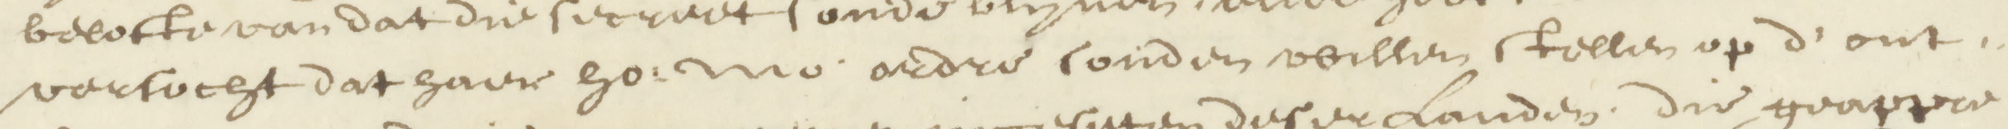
versocht dat haer ho:Mo. ordre souden willen stellen op d'ont„
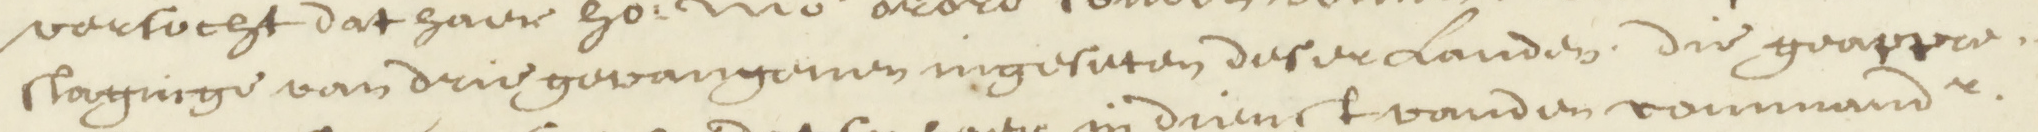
slaginge van drie gevangenen ingeseten deser Landen, die geappre„
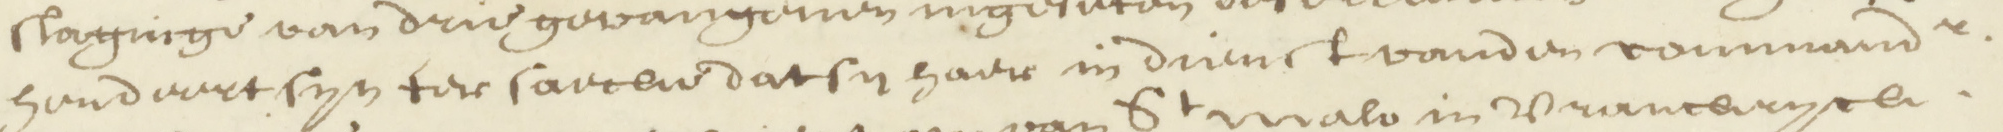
hendeert syn ter saecke dat sy haer in dienst vanden commandr.
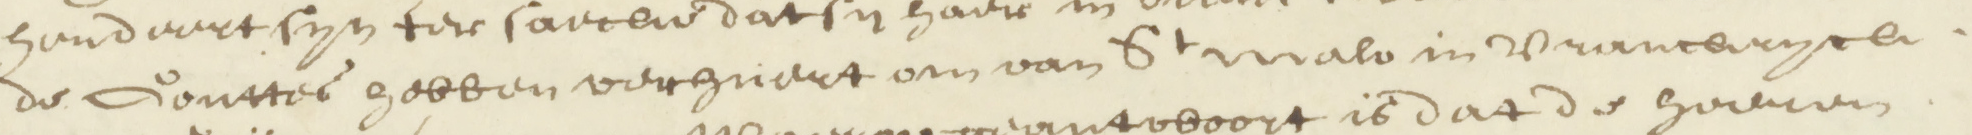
de Gonttes hebben verhuert om van St Malo in Vranckryck
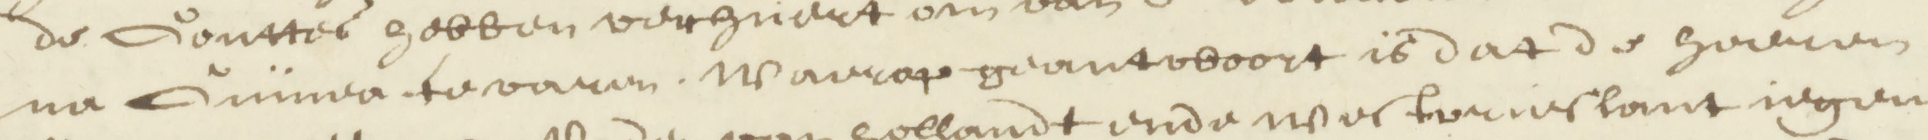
na Guïnea te varen. Waerop geantwoort is dat de heeren
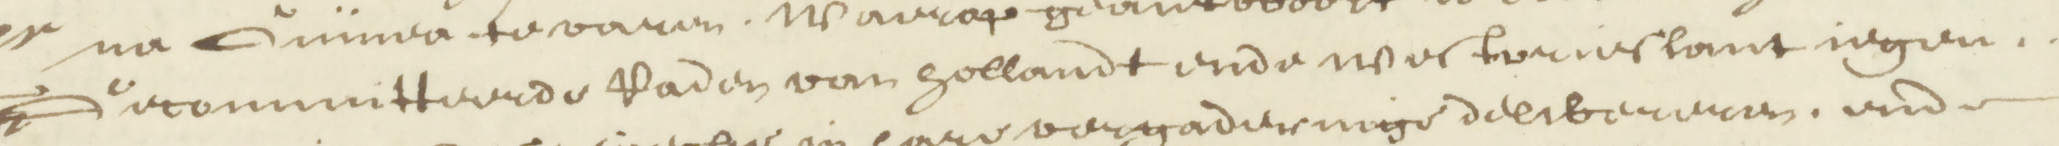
Gecommitteerde Raden van hollandt ende Westvrieslant iegen„
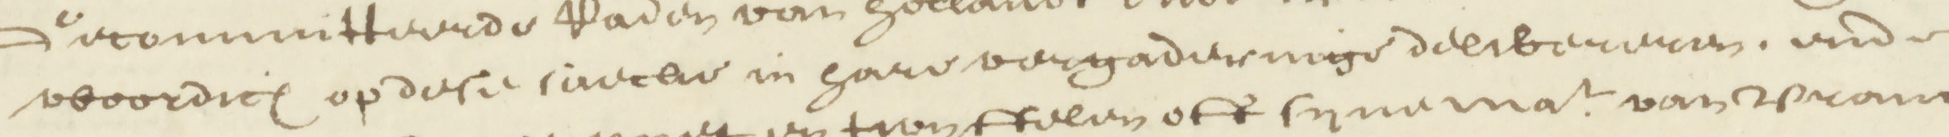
woordich op dese saecke in hare vergaderinge delibereren, ende
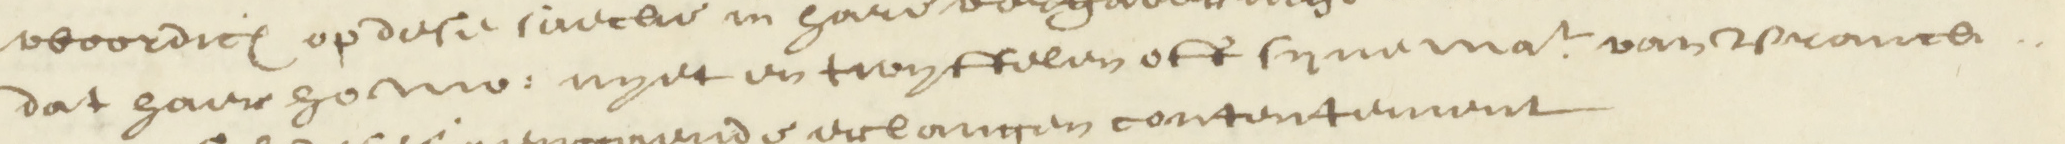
dat haer ho Mo: nyet en twyffelen off syne Mat. van Vranck„
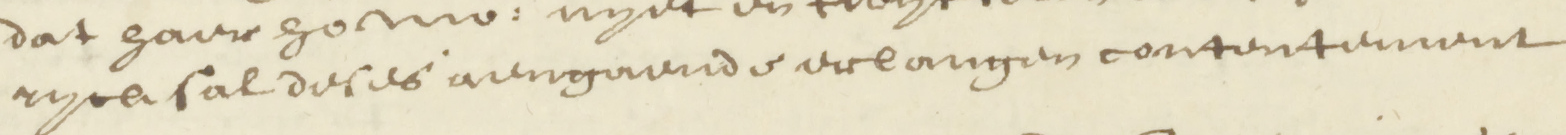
ryck sal deses aengaende erlangen contentement
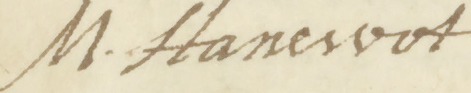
M. Hanewot
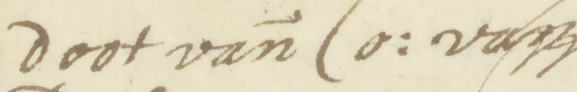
doot van Co: van
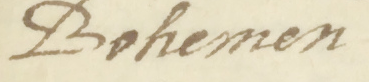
Bohemen
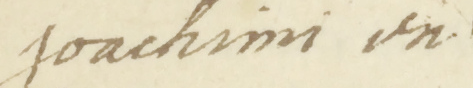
Joachimi en
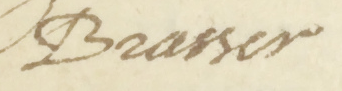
Brasser
